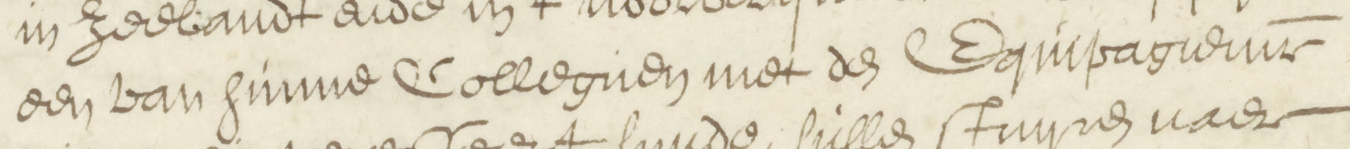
een van hunne Collegien met de Equipagiemr
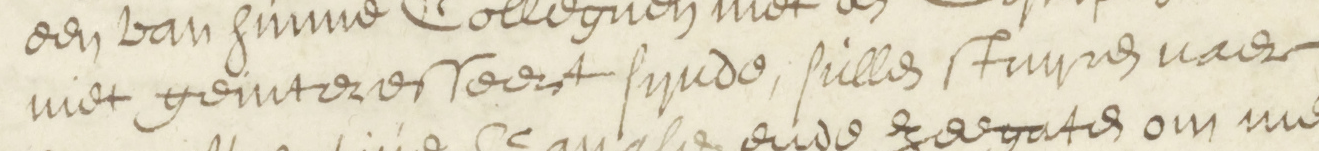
niet geinteresseert synde, sullen stuyren naer
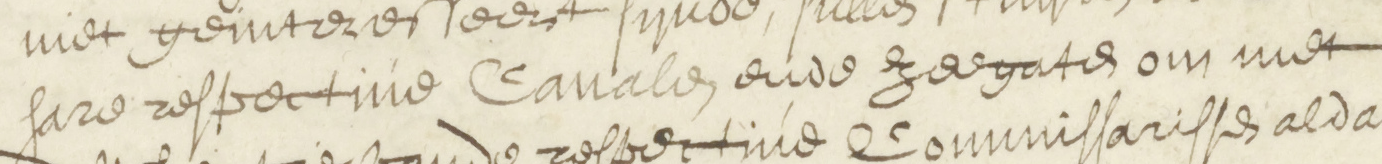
hare respectiue Canalen ende zeegaten om met
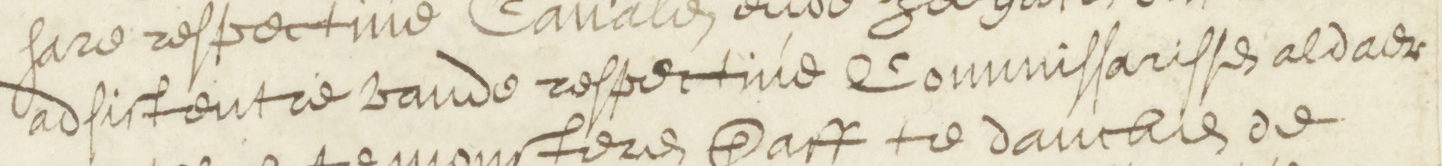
adsistentie vande respectiue Commissarissen aldaer
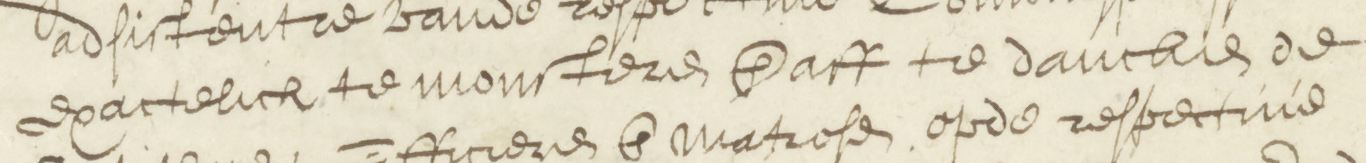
exactelick te monsteren & aff te dancken de
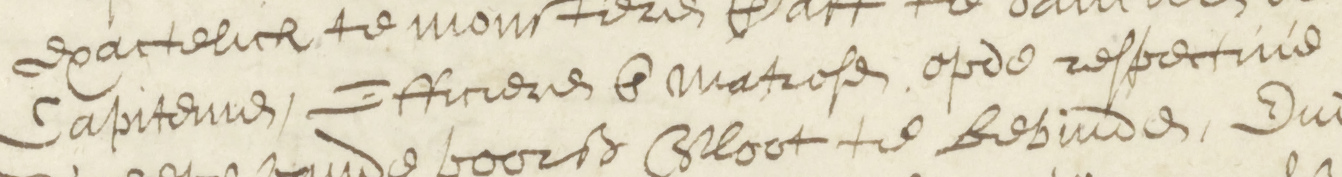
Capiteinen, Officieren & matrosen opde respectiue
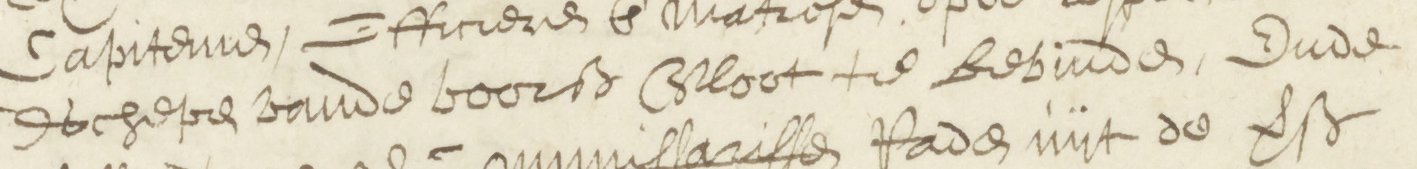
schepen vande voorsz Vloot te bevinden. Ende
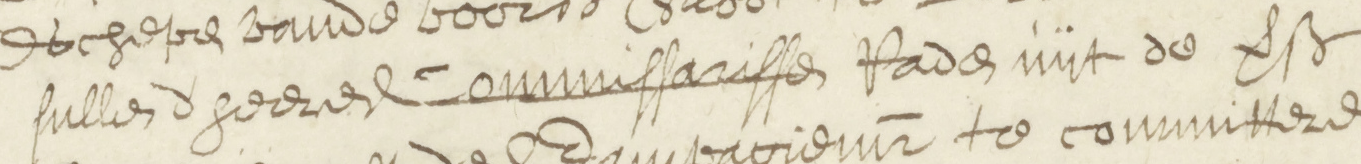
sullen d'heeren Commissarissen Raden uijt de vsz
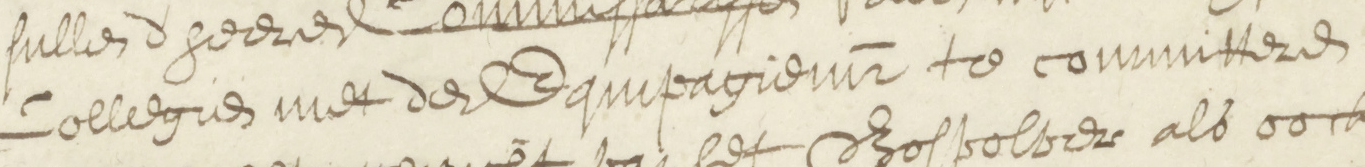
Collegien met den Equipagiemr te committeren
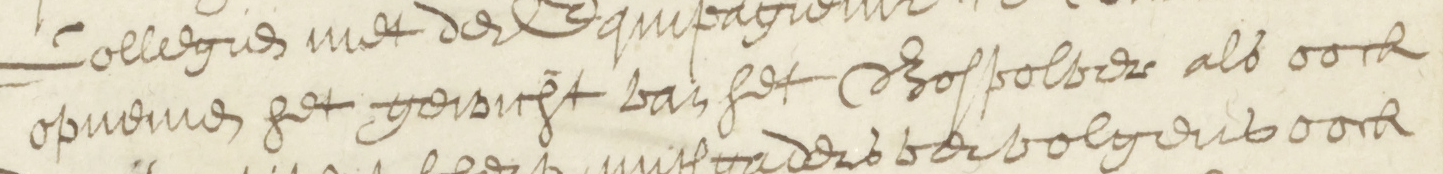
opnemen het gewicht van het Bospolver als oock
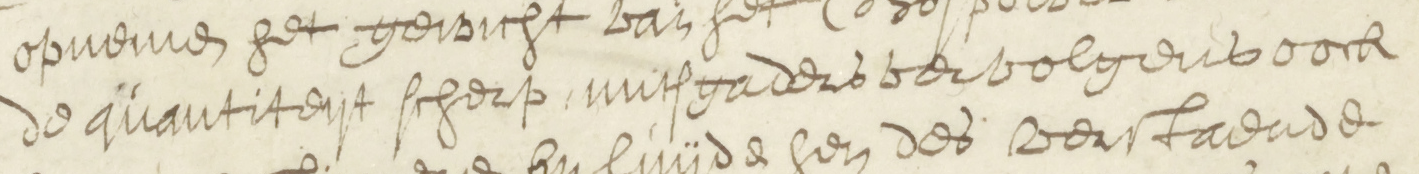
de quantiteyt scherp, mitsgaders vervolgens oock
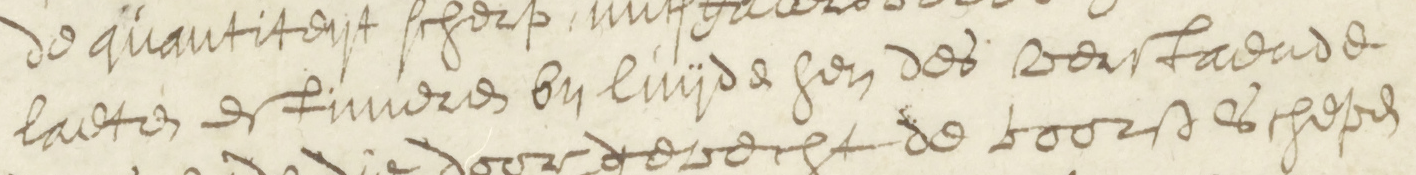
laeten estimeren by luijden hen des verstaende
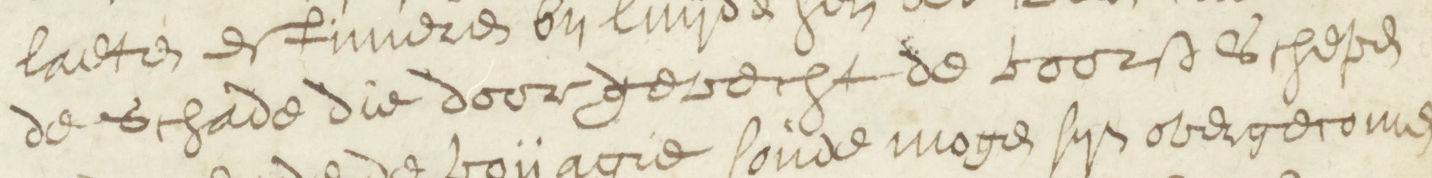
de schade die door gevecht de voorsz Schepen
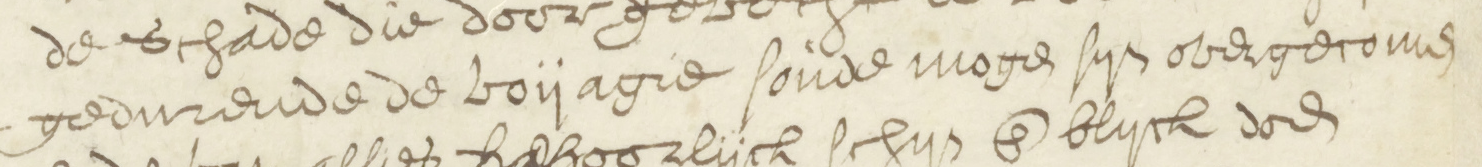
gedurende de voijagie soude mogen syn overgecomen
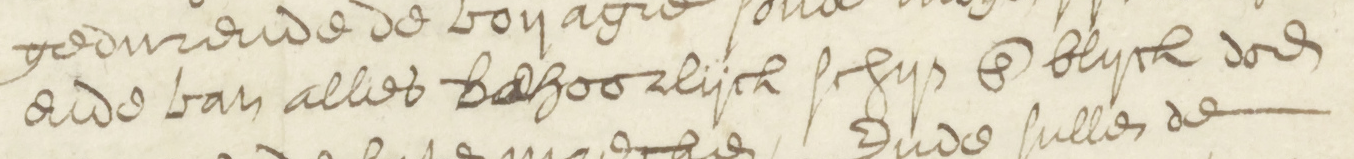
Ende van alles behoorlijck schyn & blyck doen
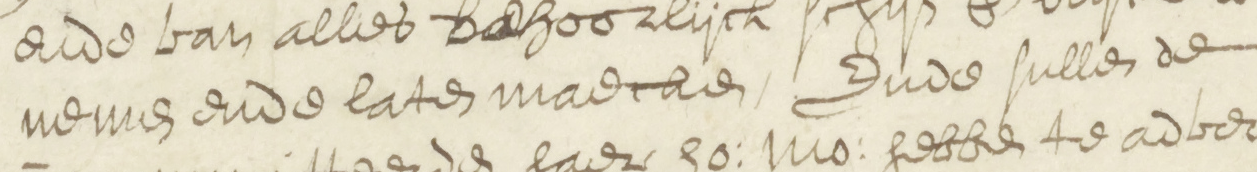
nemen ende laten maecken. Ende sullen de
